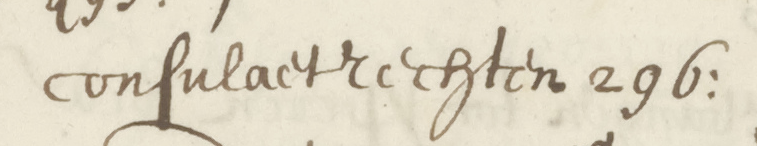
consulaetrechten 296:
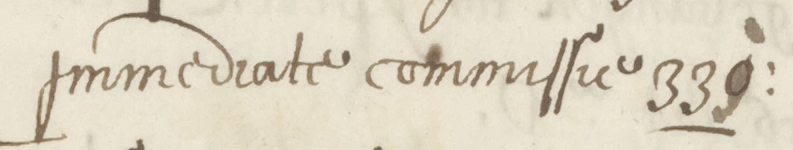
immediate commissie 339:
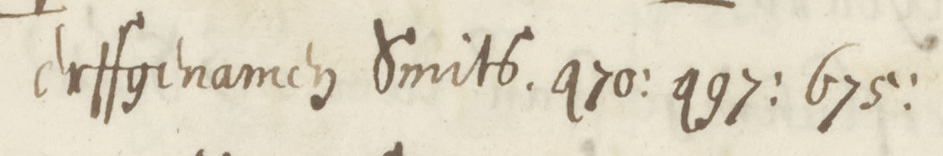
Erffgenamen Smits. 470: 497: 675:
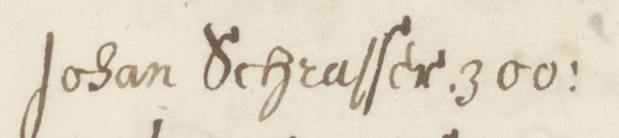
Johan Schrasser. 300:
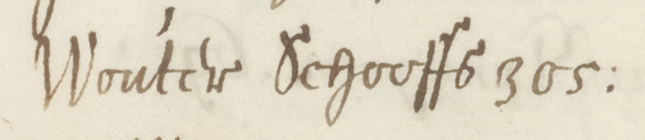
Wouter Schooffs 305:
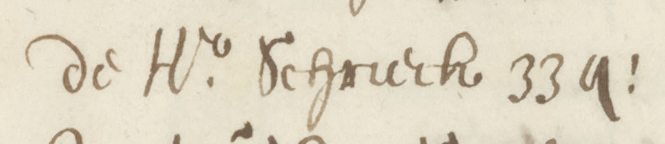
de Hr. Schrieck 334:
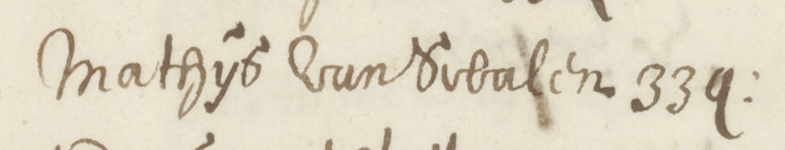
Mathijs van Swalen 334:
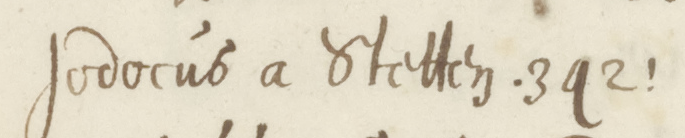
Jodocus a Stetten. 342:
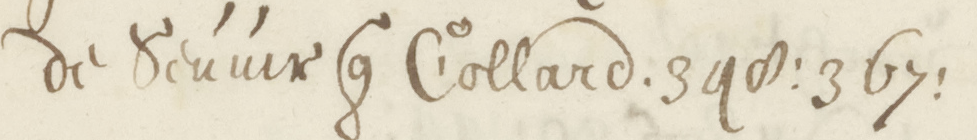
de Seuuir Ca. Collard. 348: 367:
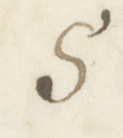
S
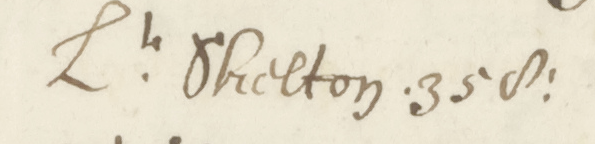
Lt. Skelton. 358:
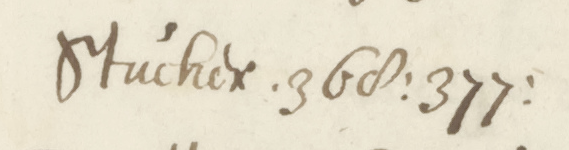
Stucker. 368: 377:
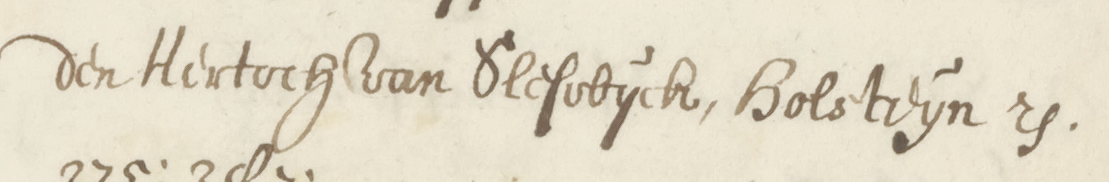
den Hertoch van Sleswijck, Holsteijn @.
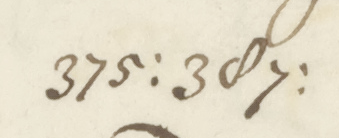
375: 387:
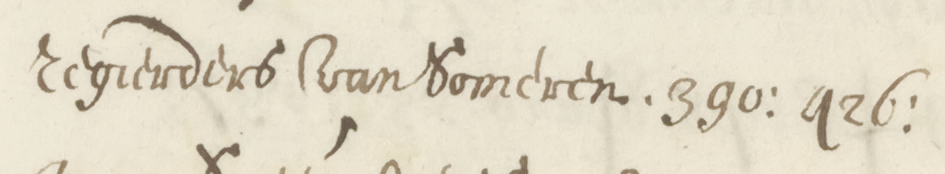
regierders van Someren. 390: 426:
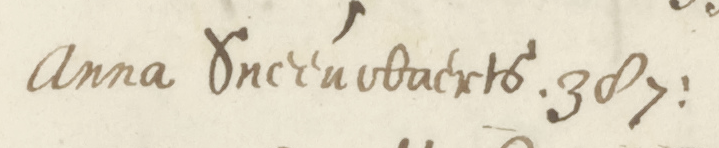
Anna Sneeuwaerts. 387:
